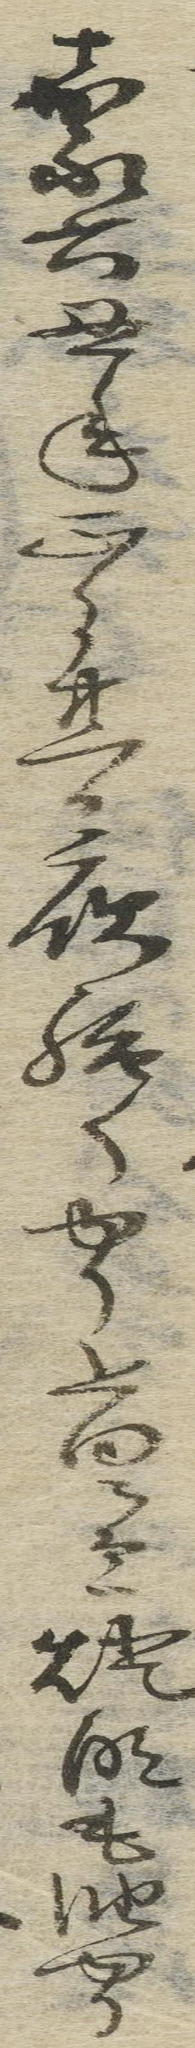嘉永六丑年正月廿一日夜強くゆり上田二而ハ燈明も油ゆり
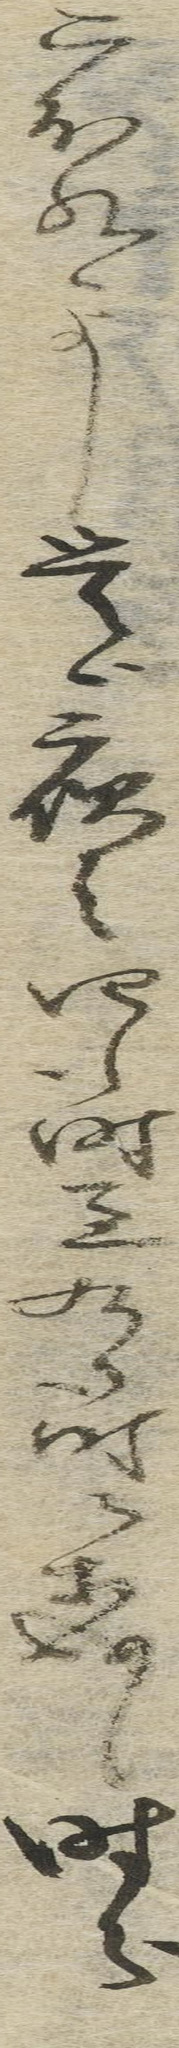こわれ候よし是ハ夜之四ッ過九ッ時二相成候時分
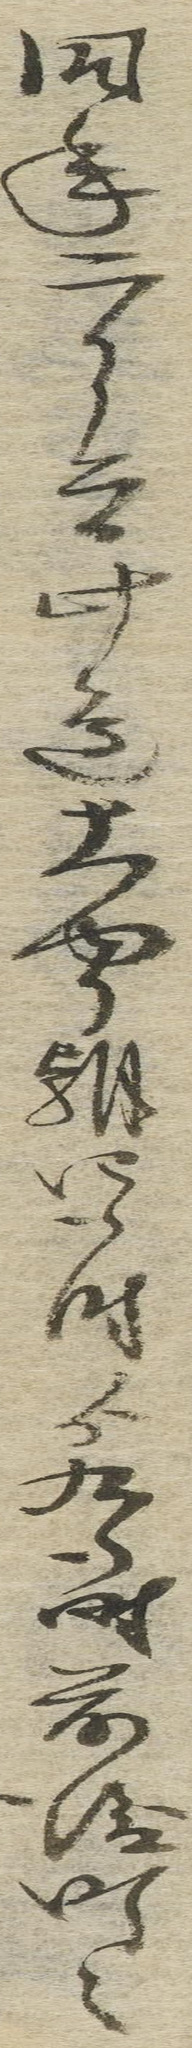同年二月二日此辺大ゆり朝四ッ時ゟ九ッ時前後町々
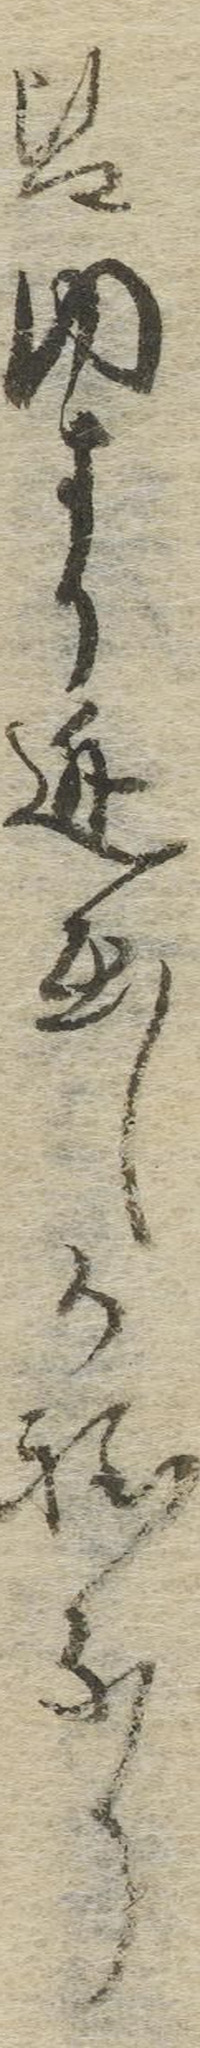皆内より逃出し候程なり
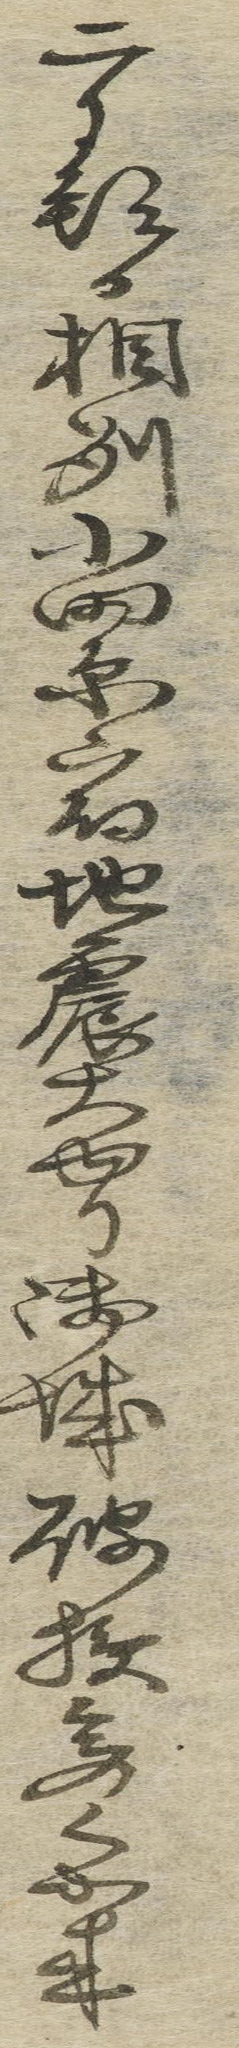二月朔日相州小田原宿地震大ゆり御城破損多く相成
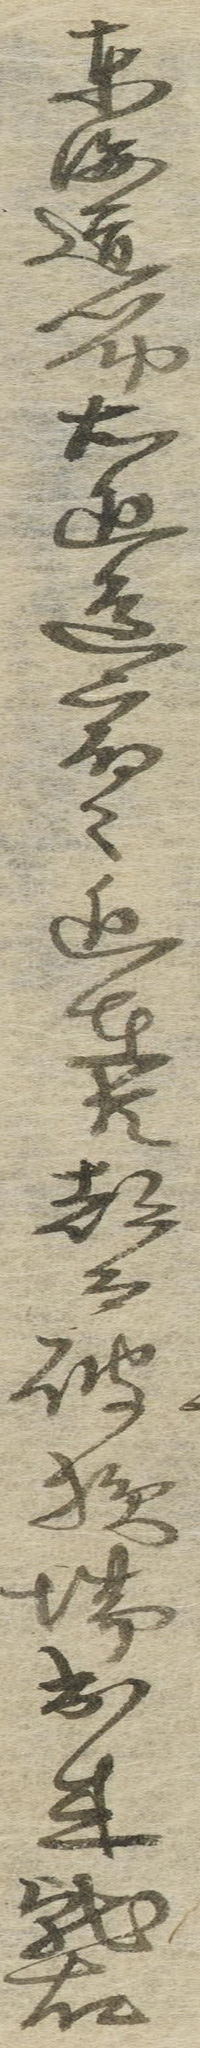東海道筋右近辺宿々近在共都而破損場出来然故
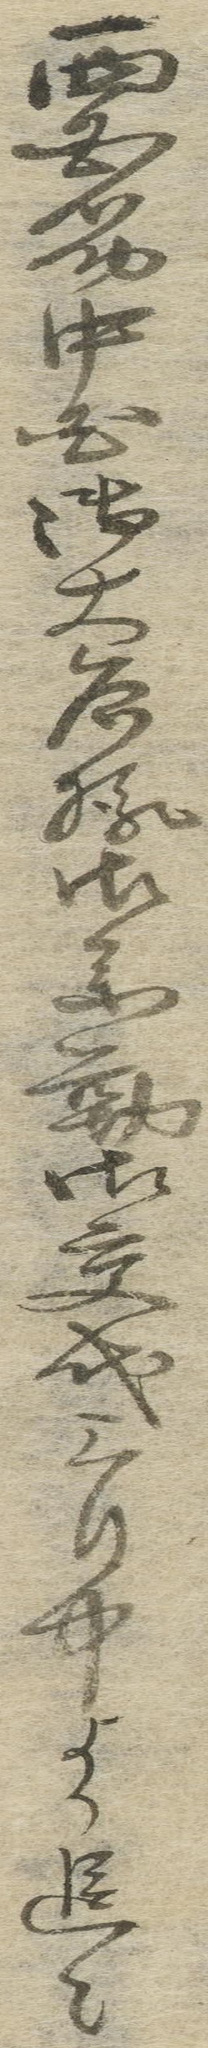西国筋中国御大名様御参勤御交代三月中より追々

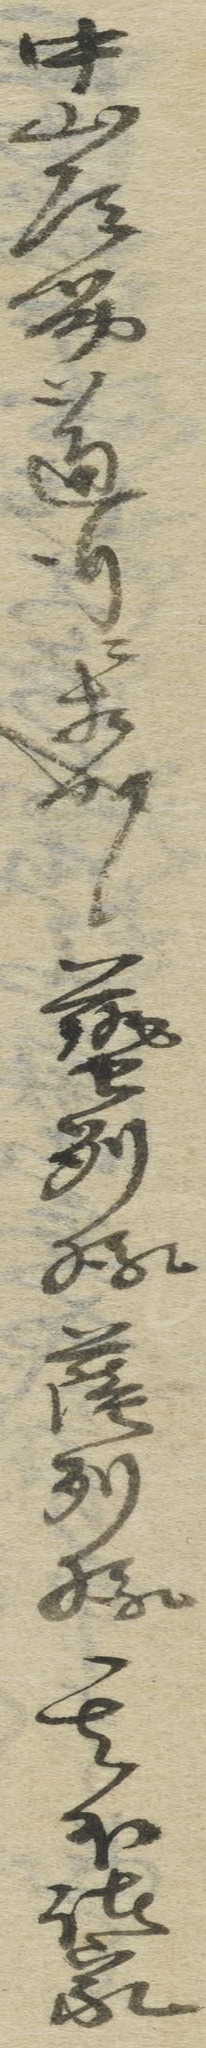中山道筋御通行二相成候芸州州様薩州様其外諸家
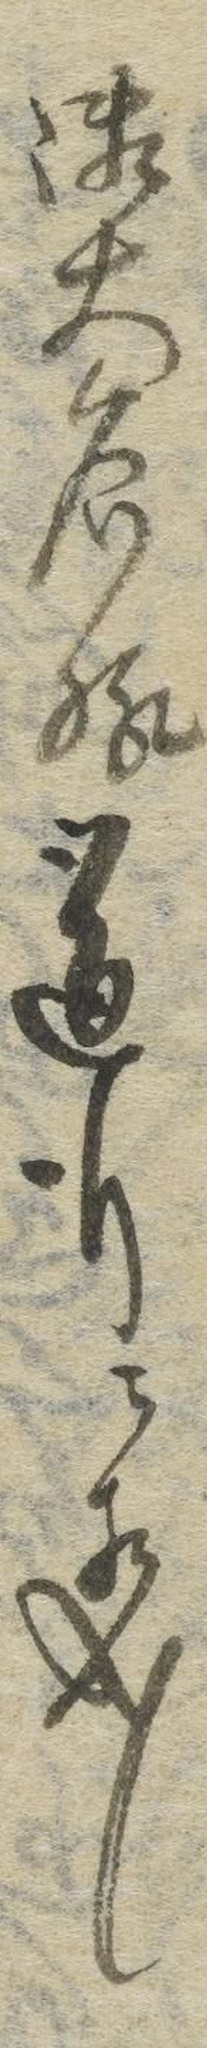御大名様御通行二相成候
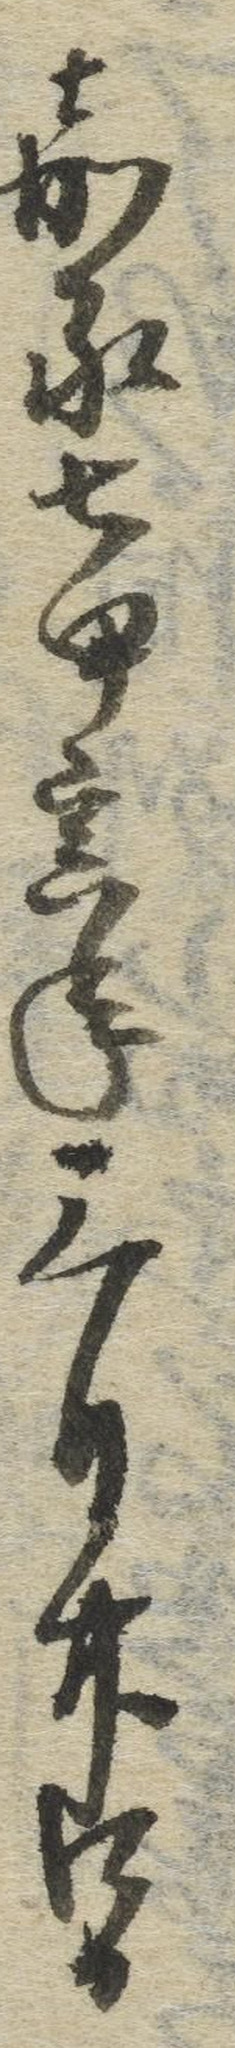嘉永七甲寅年三月廿四日
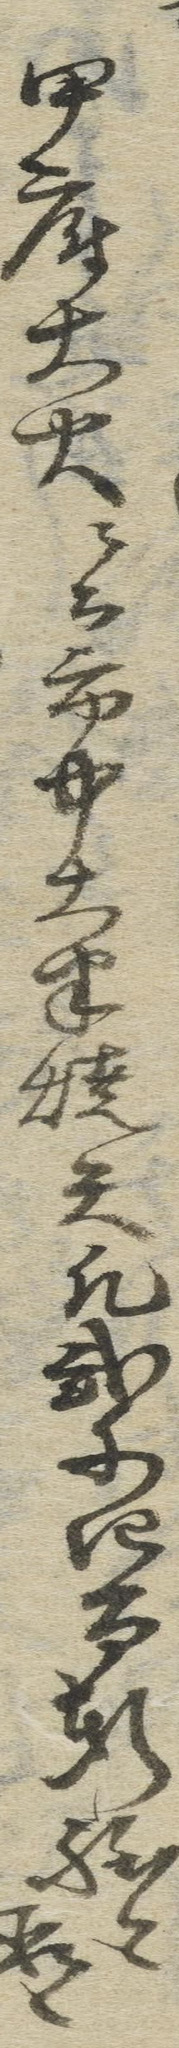甲府大火二而市中大半焼失凡弐千四百軒程二承候
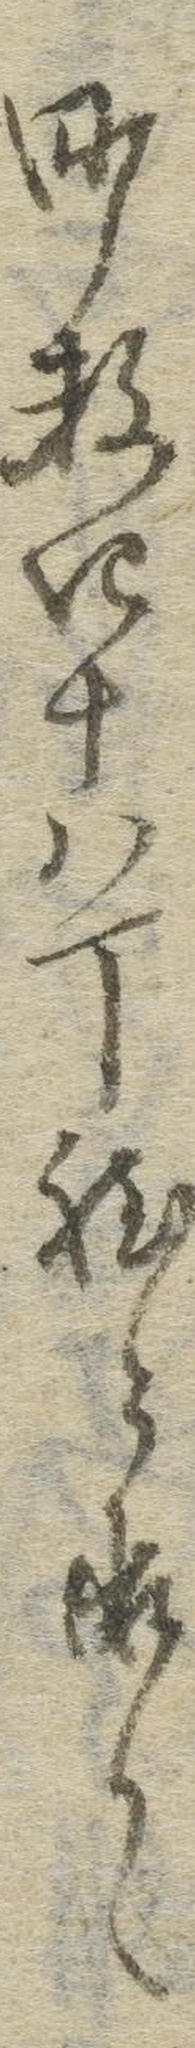町数四十八丁程二承候
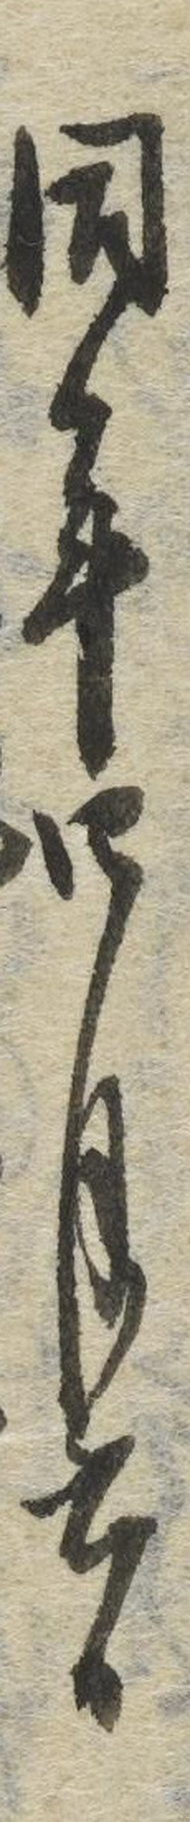同年四月六日
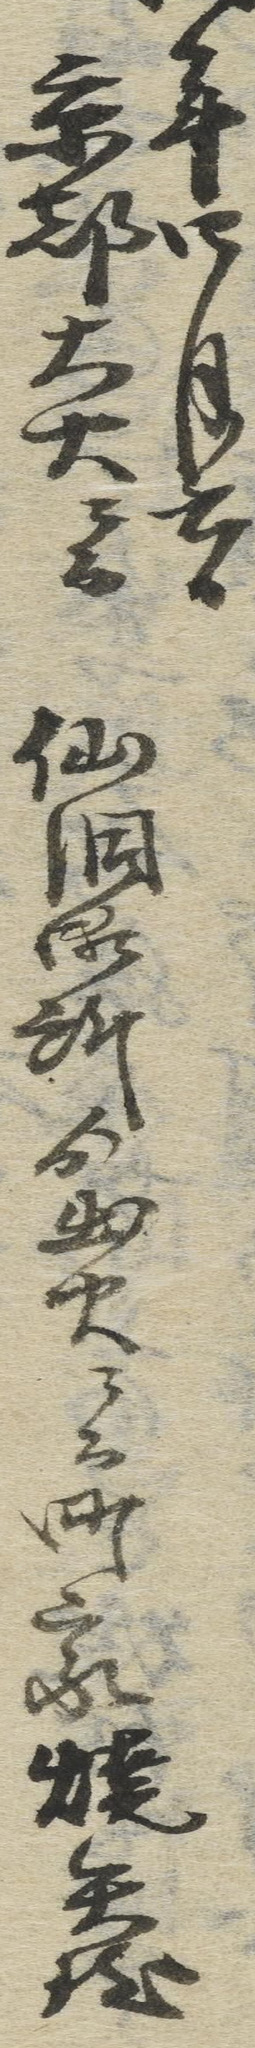京都大火二而仙洞御所ゟ出火二而町家焼失致
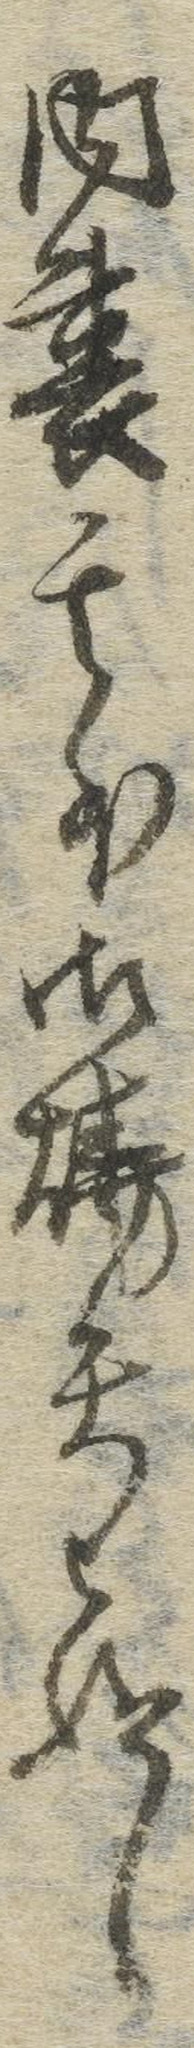内裏其外御焼失候如し
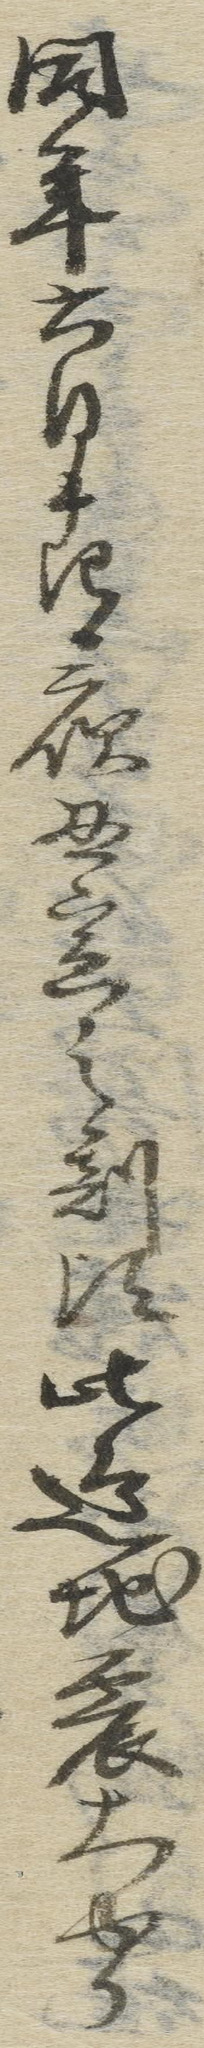同年六月十四日夜丑寅之刻頃此辺地震大ゆり
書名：信濃越後　地震書留
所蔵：東京大学地震研究所図書室 Earthquake Research Institute Library, The University of Tokyo, JAPAN
